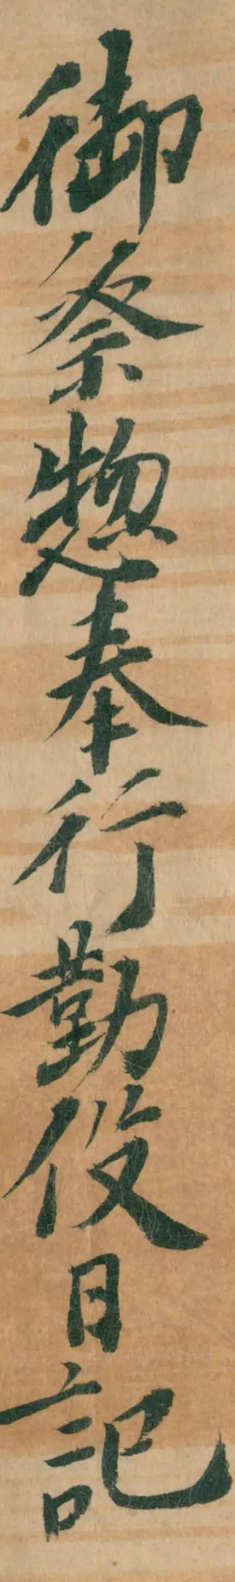御祭惣奉行勤役日記

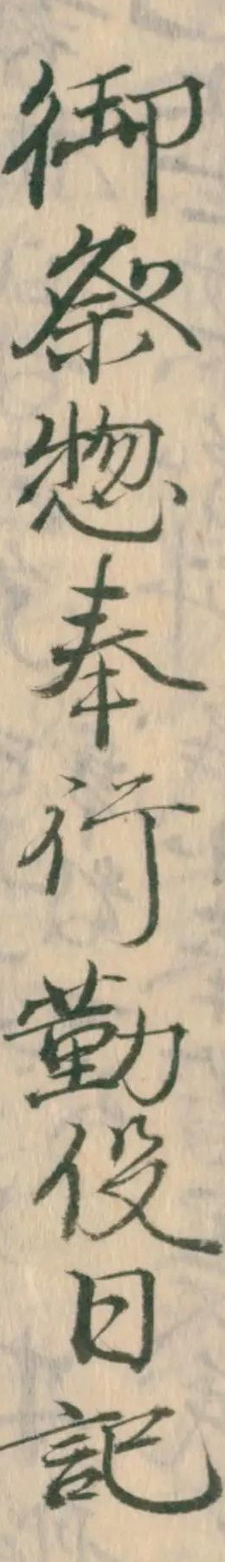御祭惣奉行勤役日記
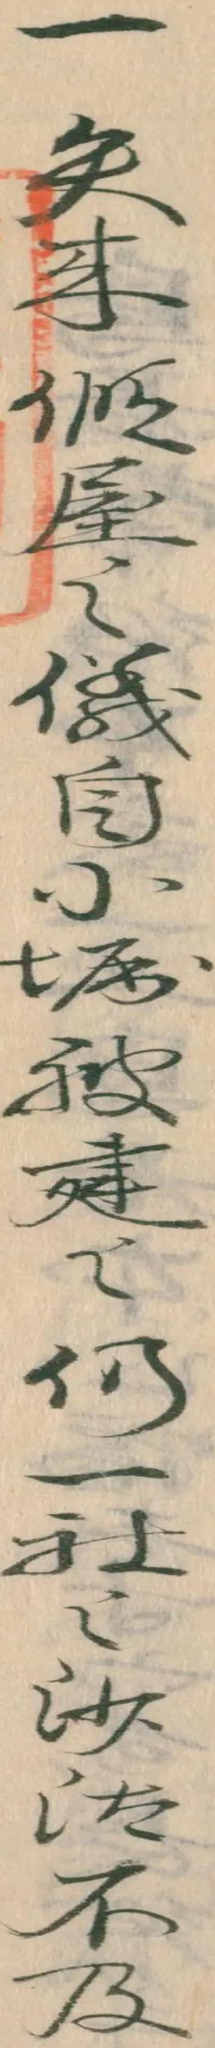一矢来仮屋之儀自小堀被建之仍一社之沙汰不及
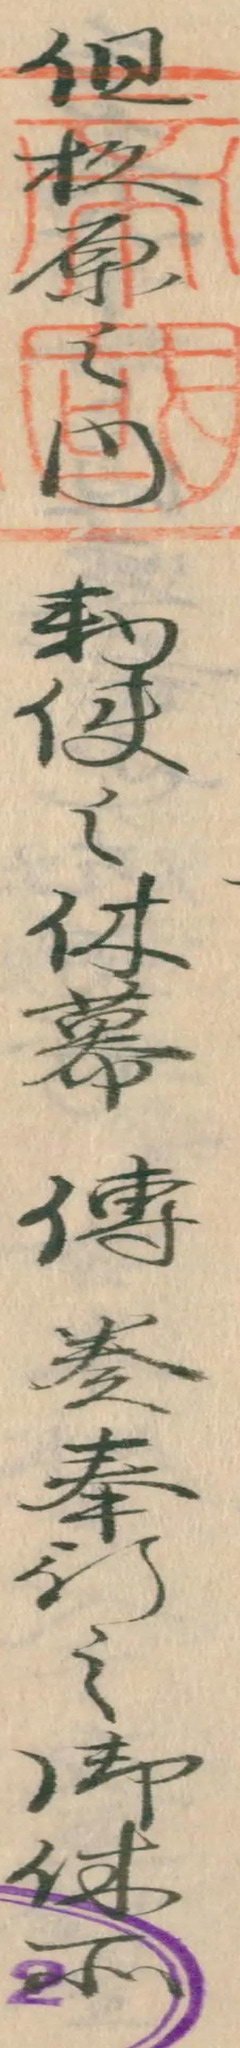但杉原之内勅使之休幕伝奏奉行之御休所
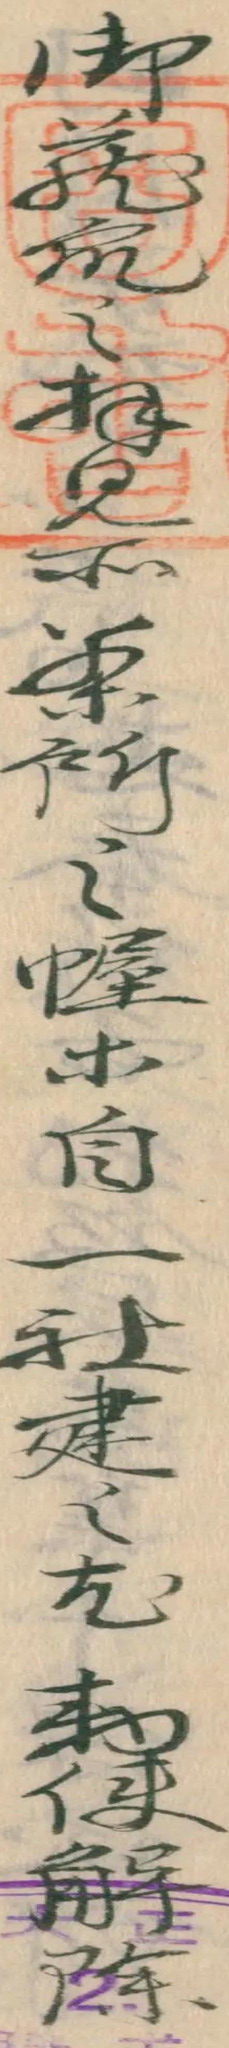御蔵衆之拝見所茶所之幄等自一社建之尤勅使解除
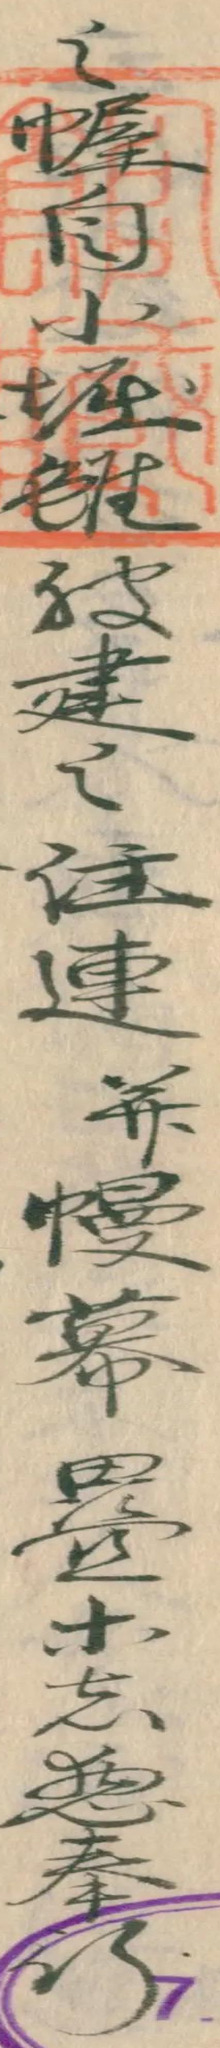之幄自小堀雖被建之注連并慢幕畳等者惣奉行
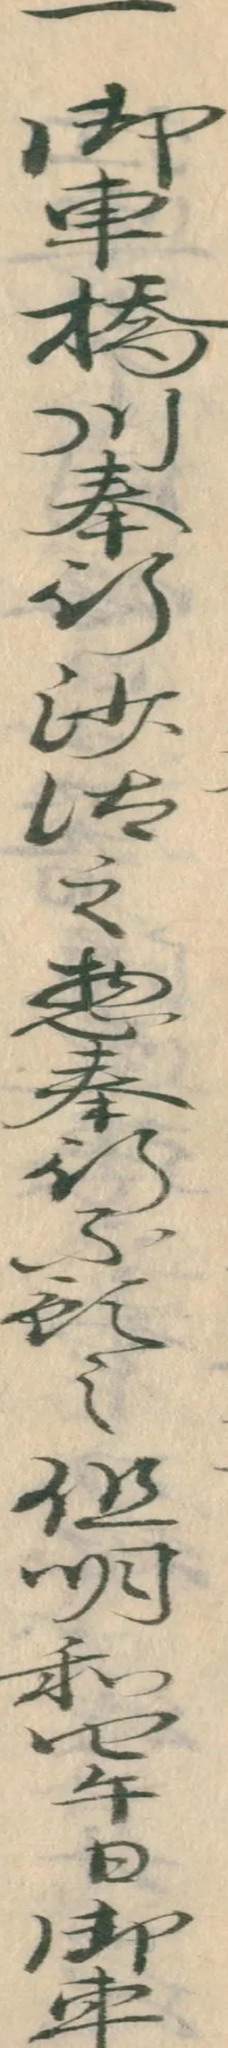一御車橋川奉行沙汰之惣奉行不預之但明和四午日御車
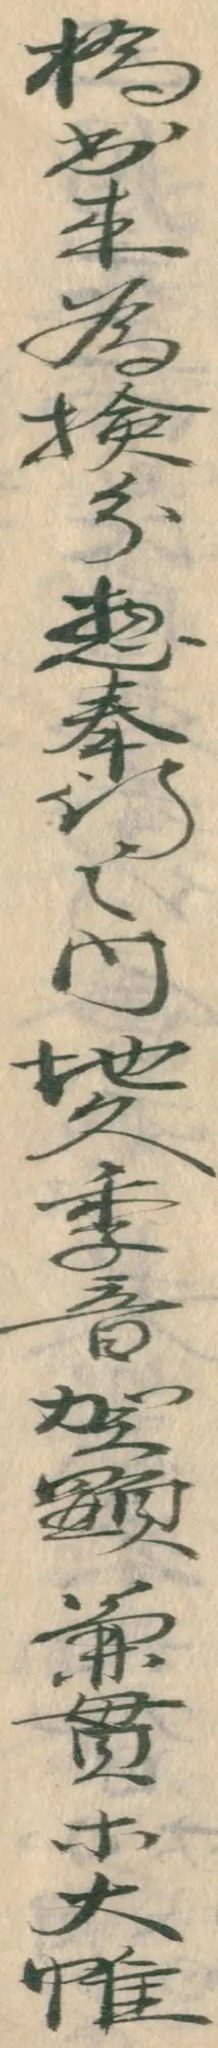橋出来為検分惣奉行之内地久季音賀顕兼貫等大帷
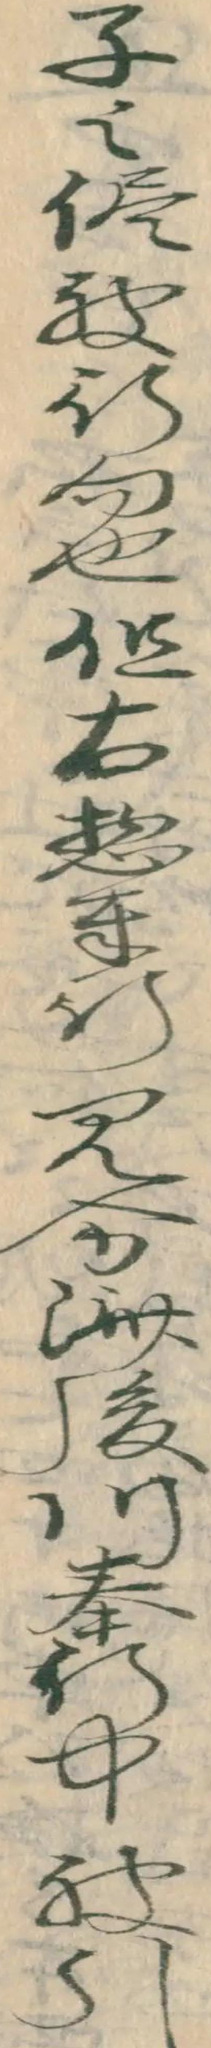子之儘被行向也但右惣奉行見分済後川奉行中被引

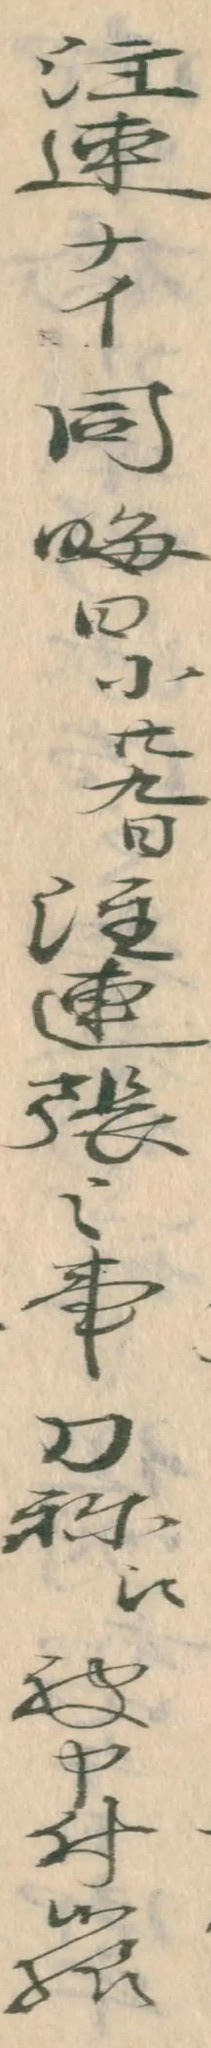注連ナイ同晦日小廿九日注連張之事刀祢江被申付候様
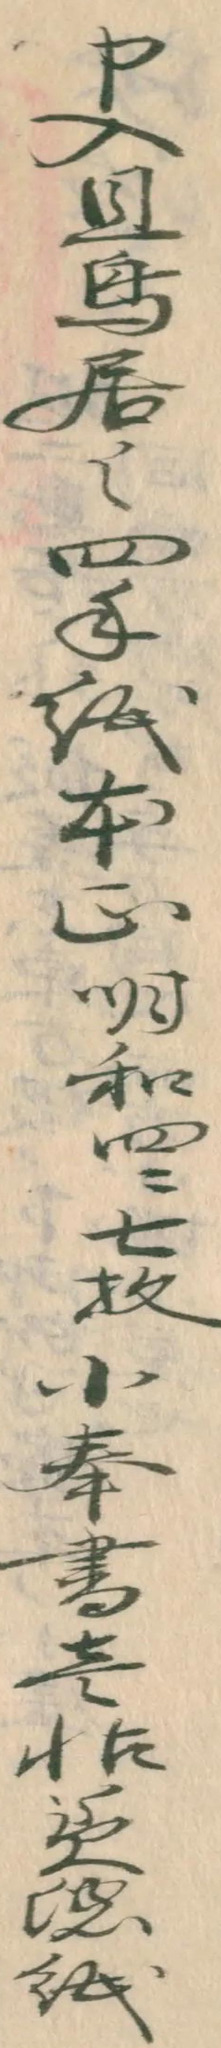申入且鳥居之四手紙本正明和四ニ七枚小奉書壱帖美濃紙
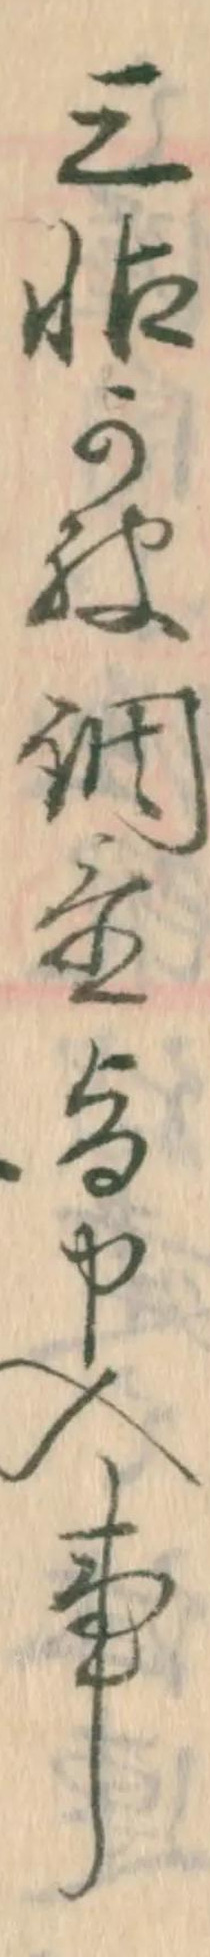三帖可被調置旨申入事
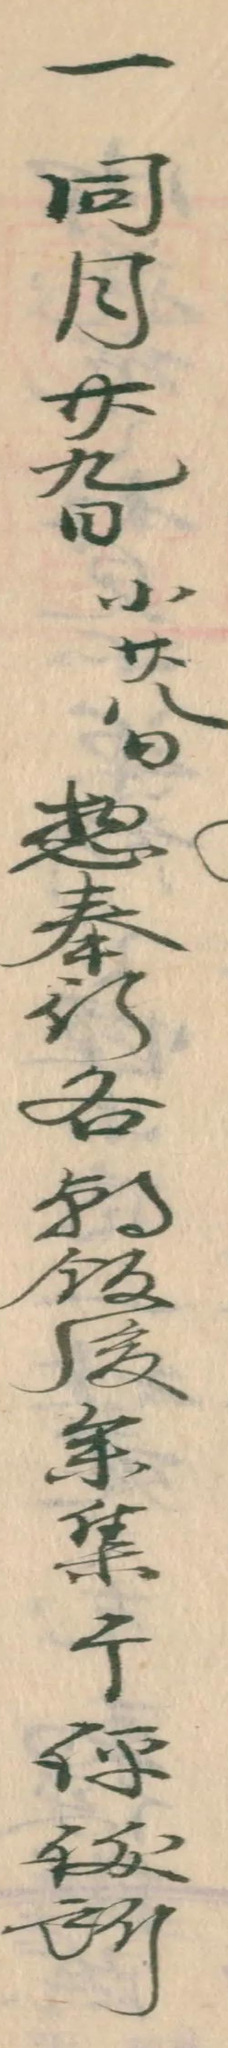一同月廿九日小廿八日惣奉行各朝飯後参集于評議所
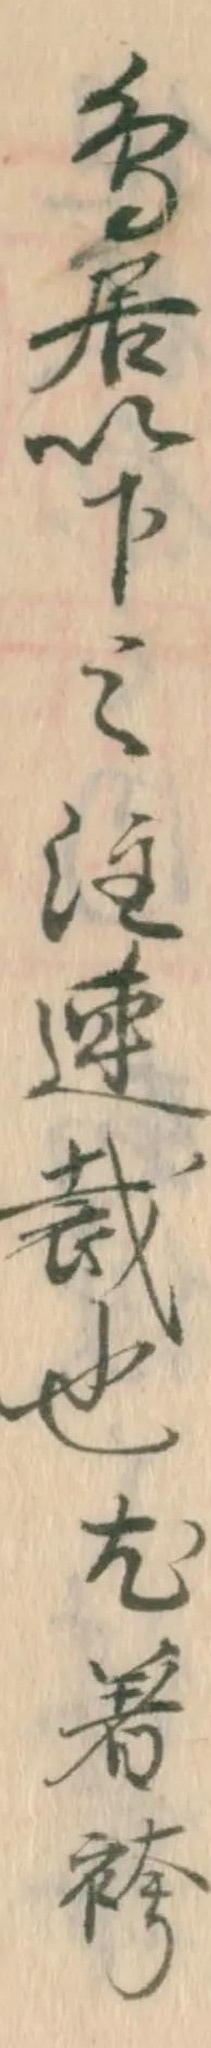鳥居以下之注連裁也尤着袴
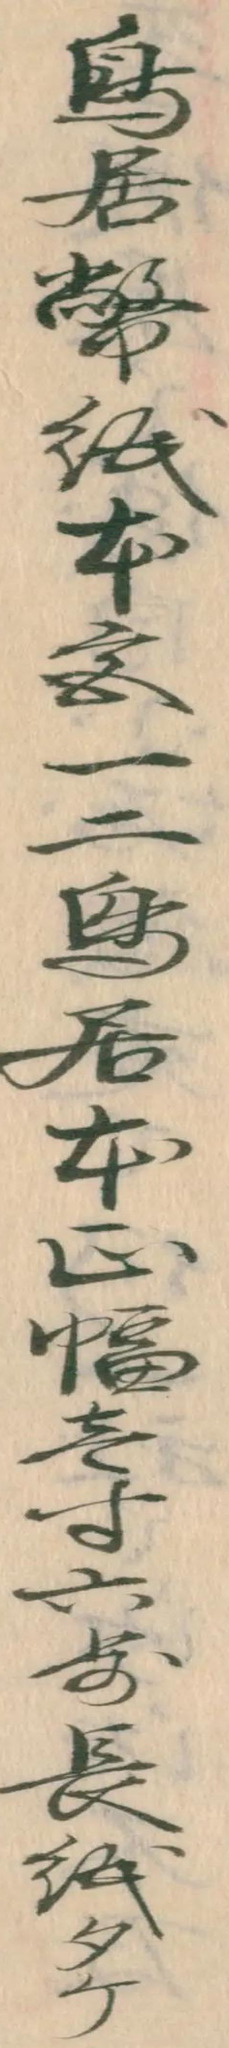鳥居幣紙本宮一二鳥居本正幅壱寸六歩長紙タケ
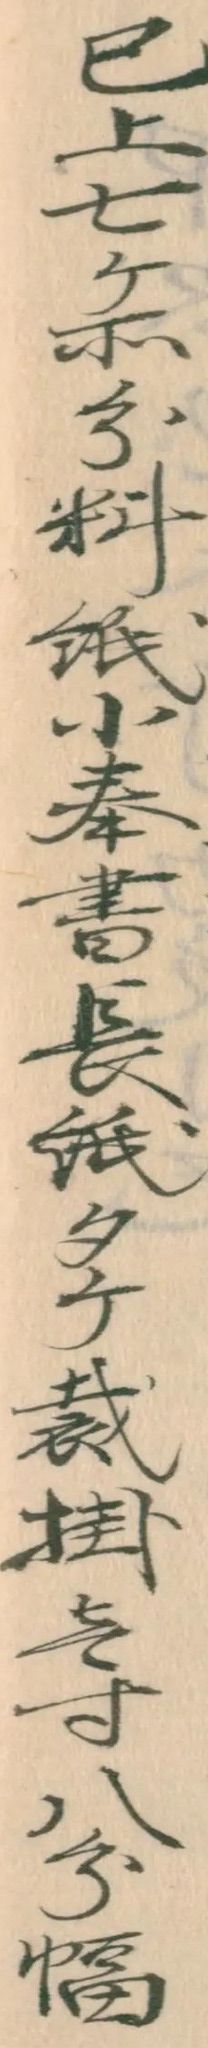已上七ヶ所分料紙小奉書長紙タケ裁掛壱寸八分幅
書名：賀茂社記録. 第6冊
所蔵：国立国会図書館 National Diet Library, JAPAN
